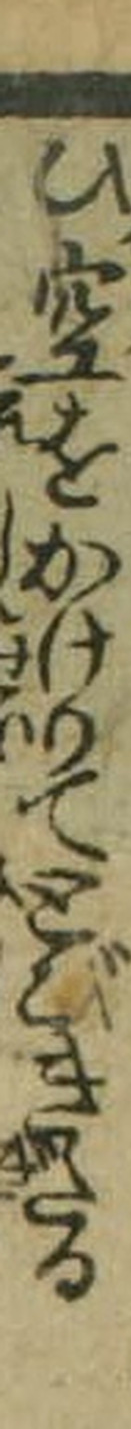ひ空をかけりてとびきたる
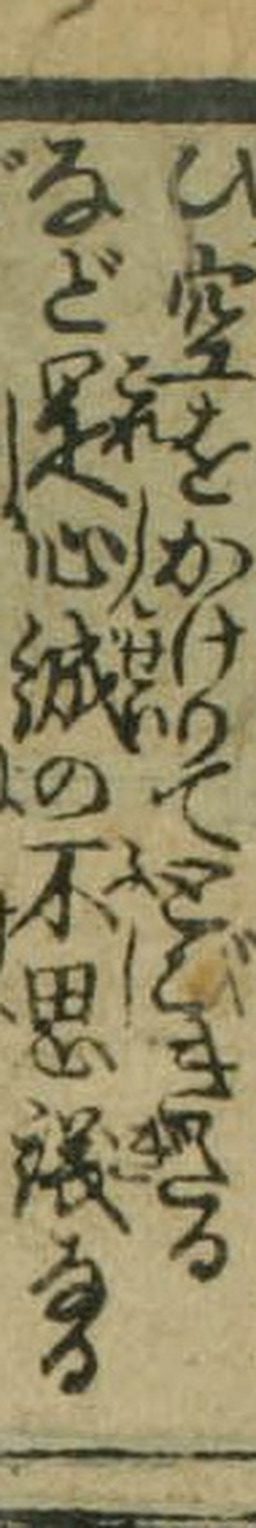など是心誠の不思議なる
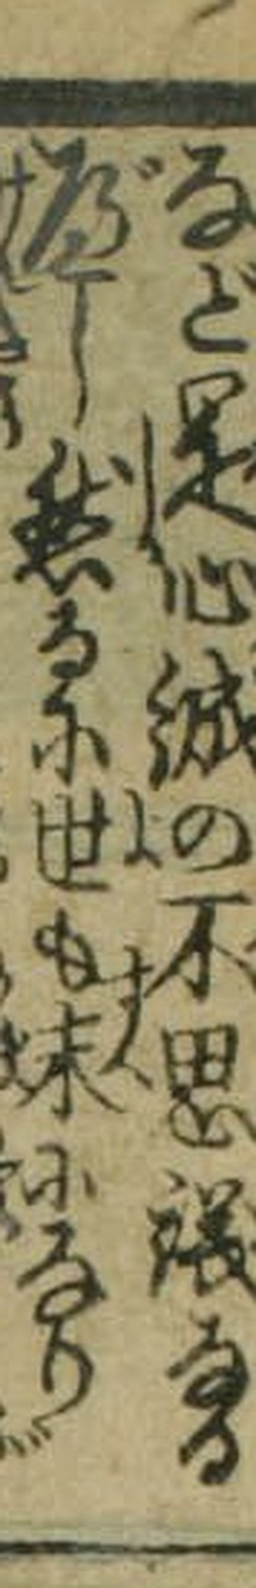べし然るに世も末になり
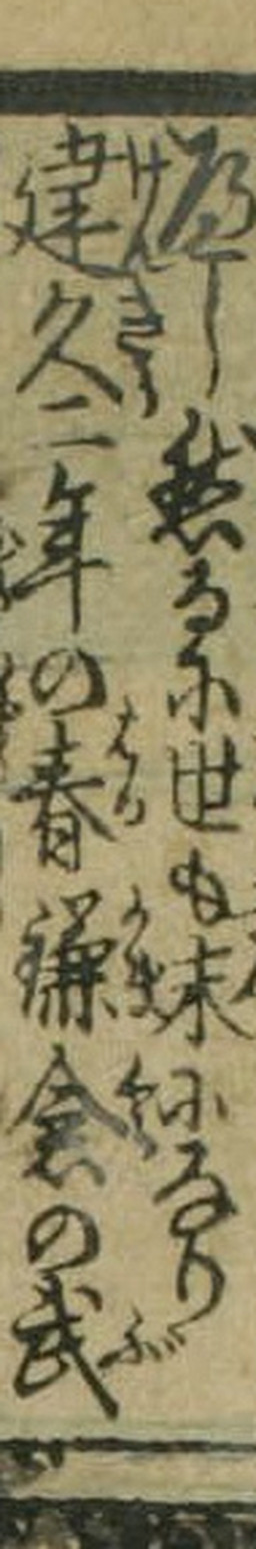建久二年の春鎌倉の武
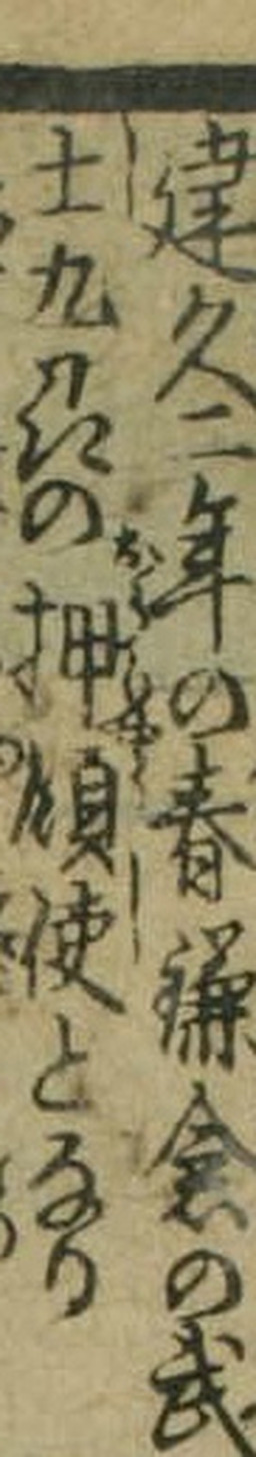士九州の押領使となり
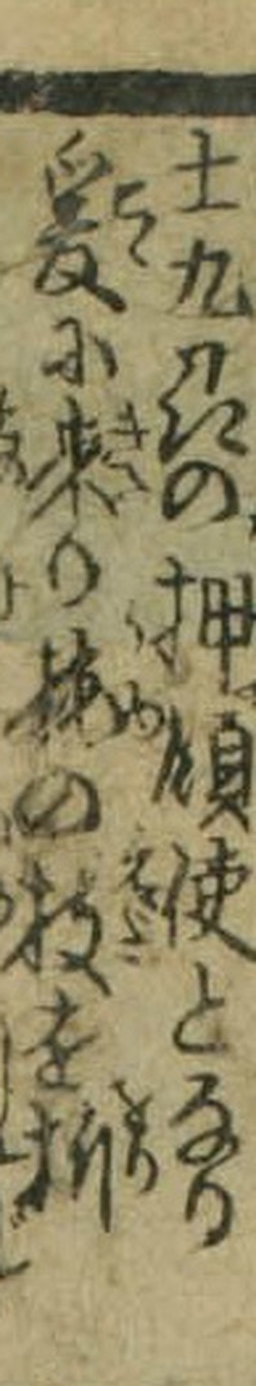爰に来り梅の枝を折
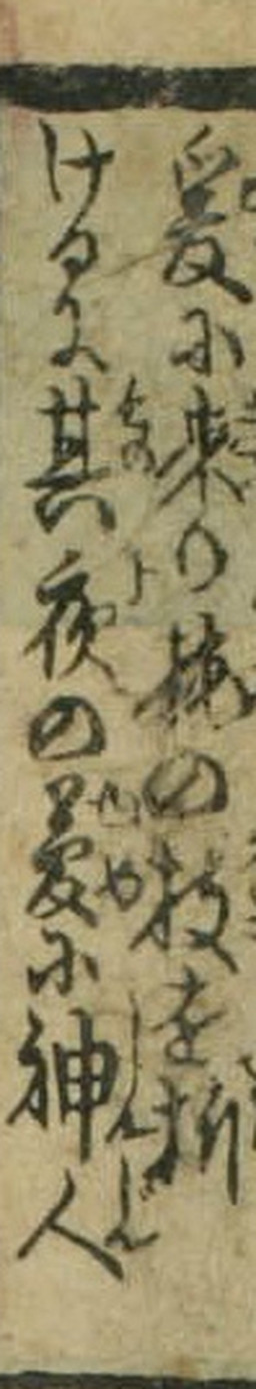けるに其夜の夢に神人
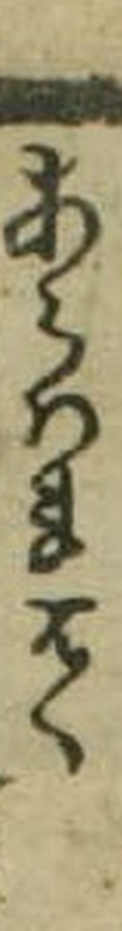あらはれて
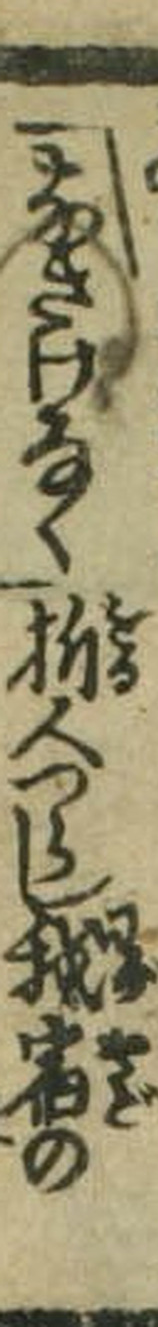〽なさけなく折人つらし我宿の
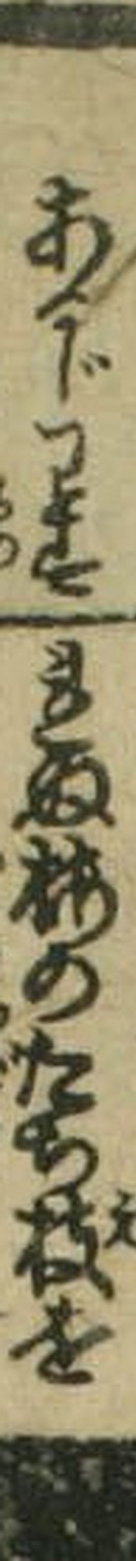あるじわすれぬ梅のたち枝を
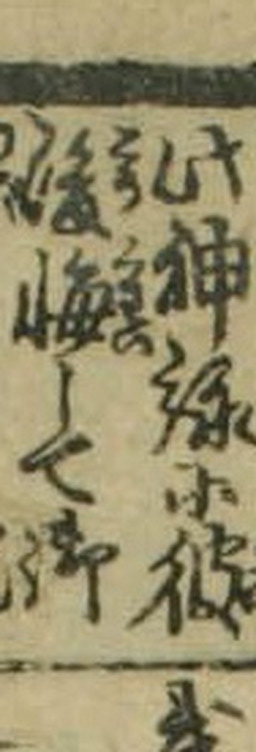後悔して御
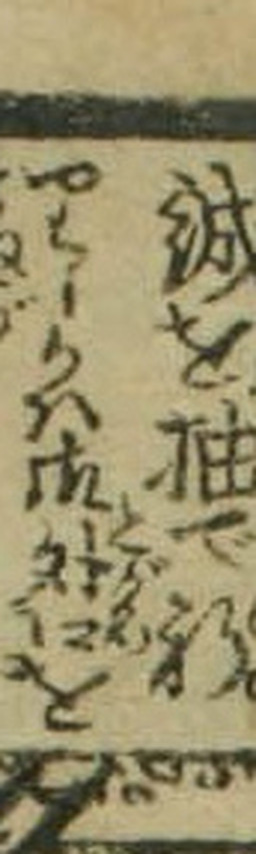りしかは御咎を
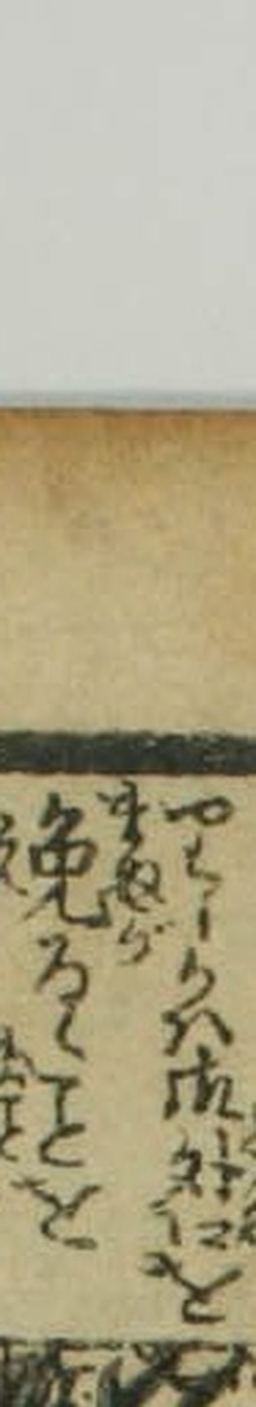免るゝことを
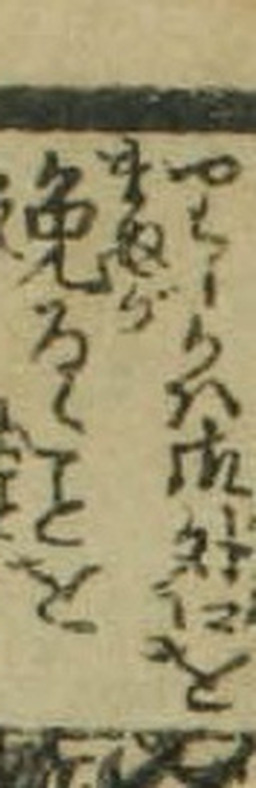免るゝことを
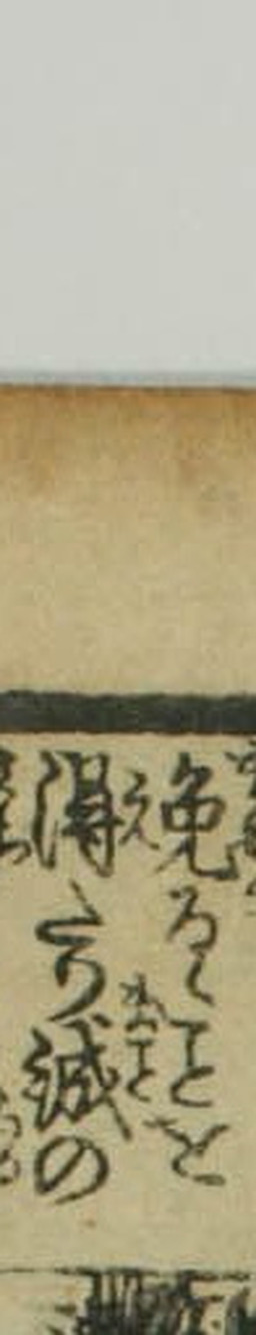得たり誠の
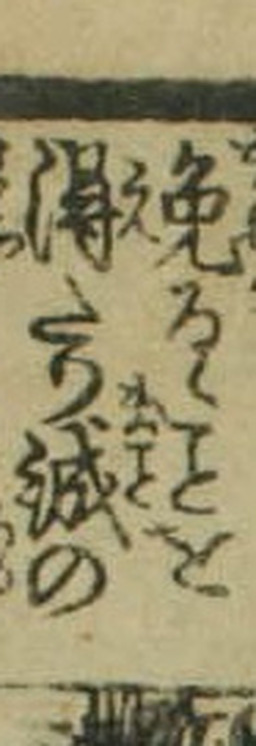得たり誠の
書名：續英雄百人一首
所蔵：東京学芸大学附属図書館
